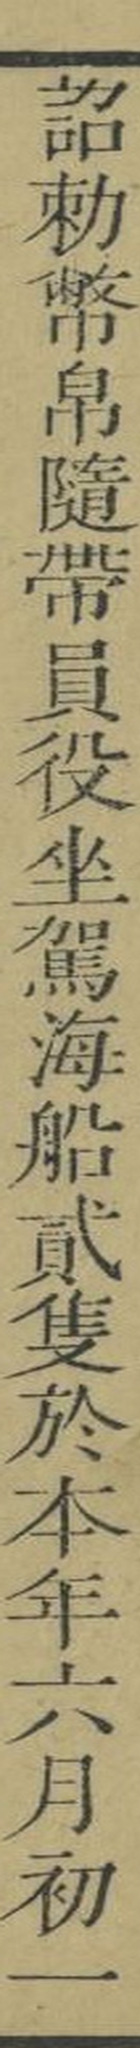詔勅幣帛隨帶員役坐駕海船貳隻於本年六月初一
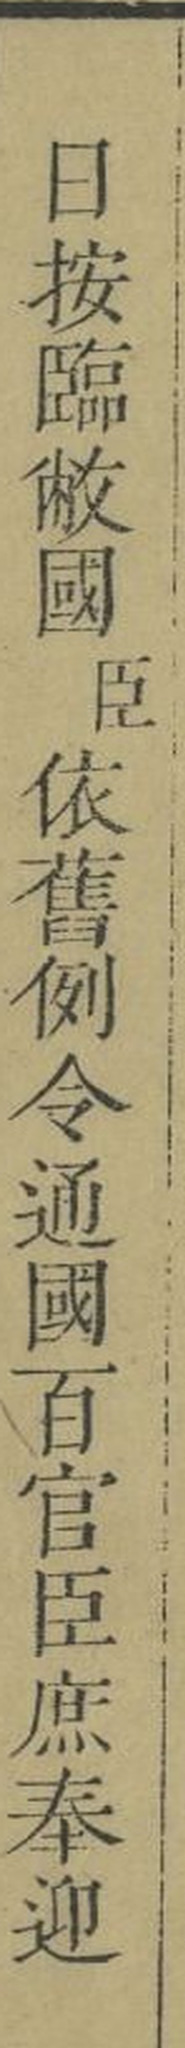日按臨敝國臣依舊例令通國百官臣庶奉迎
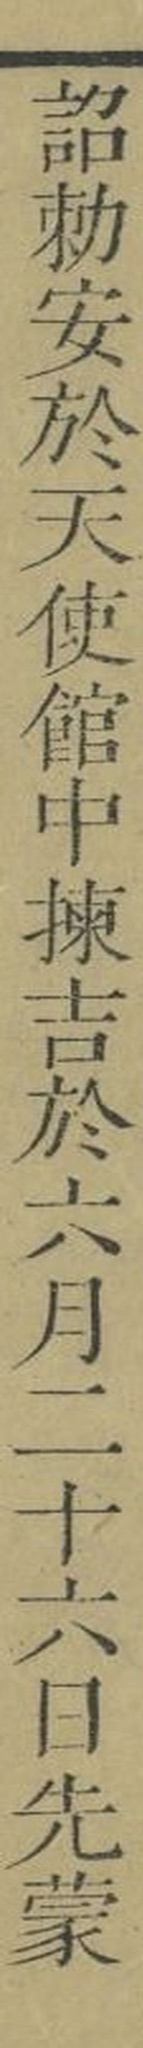詔勅安於天使館中揀吉於六月二十六日先蒙
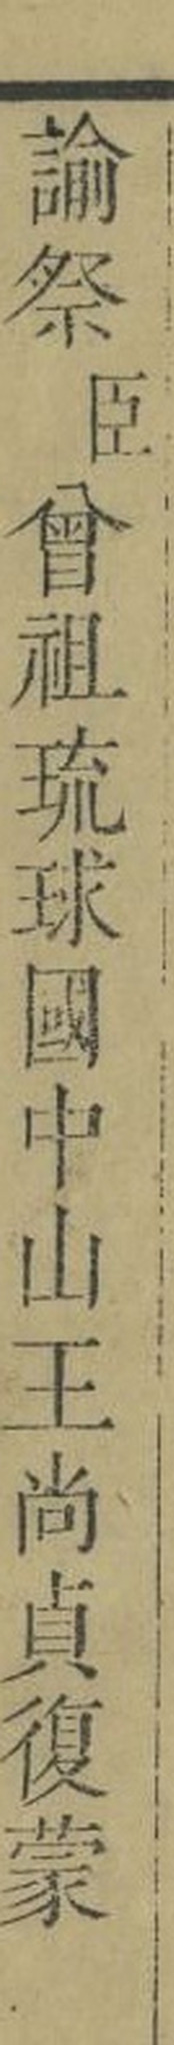諭祭臣曾祖琉球國中山王尚貞復蒙
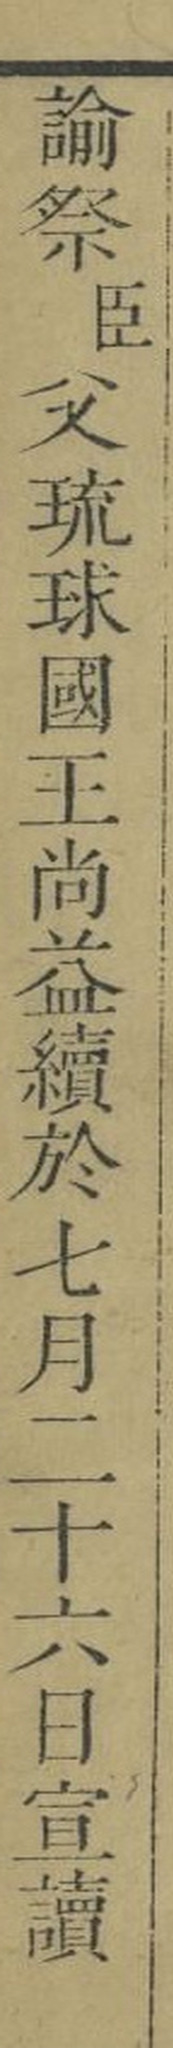諭祭臣父琉球國王尚益續於七月二十六日宣讀

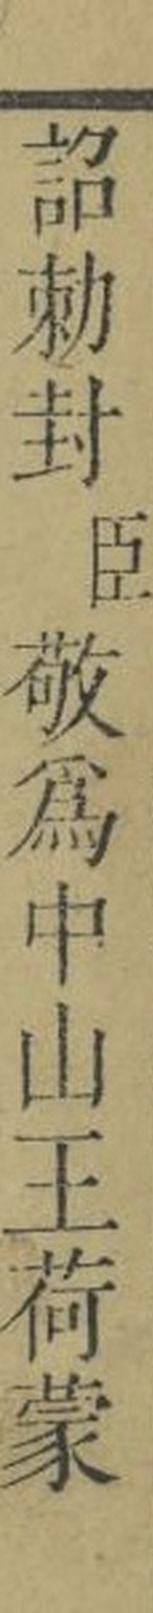詔勅封臣敬爲中山王荷蒙
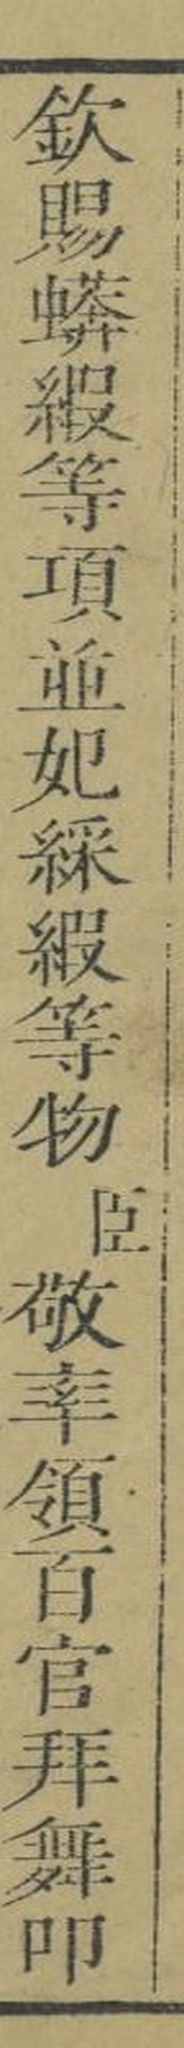欽賜蠎縀等項並妃綵縀等物臣敬率領百官拜舞叩
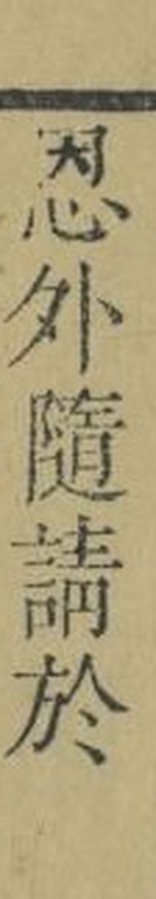恩外隨請於
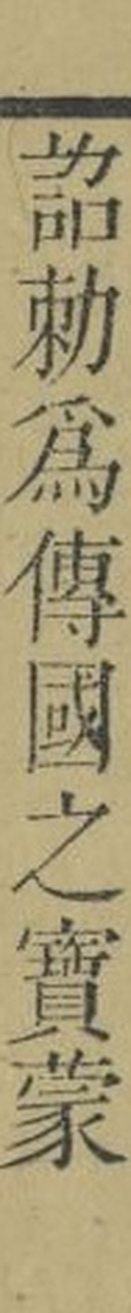詔勅爲傳國之寶蒙
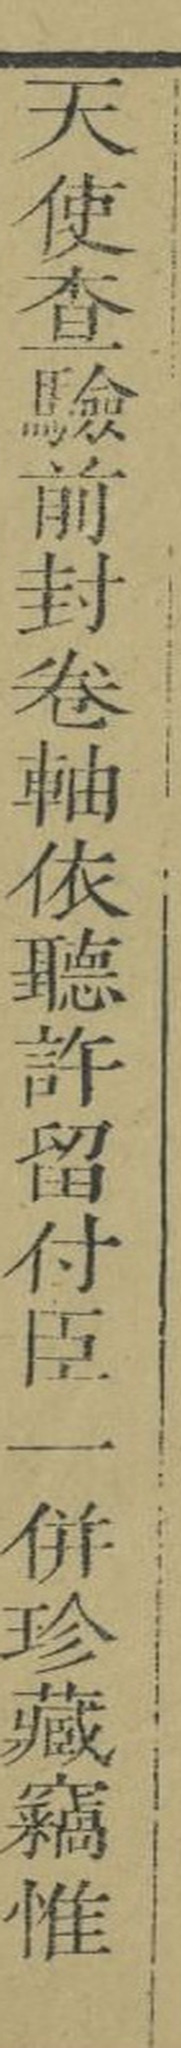天使査驗前封卷軸依聽許留付臣一併珍藏竊惟
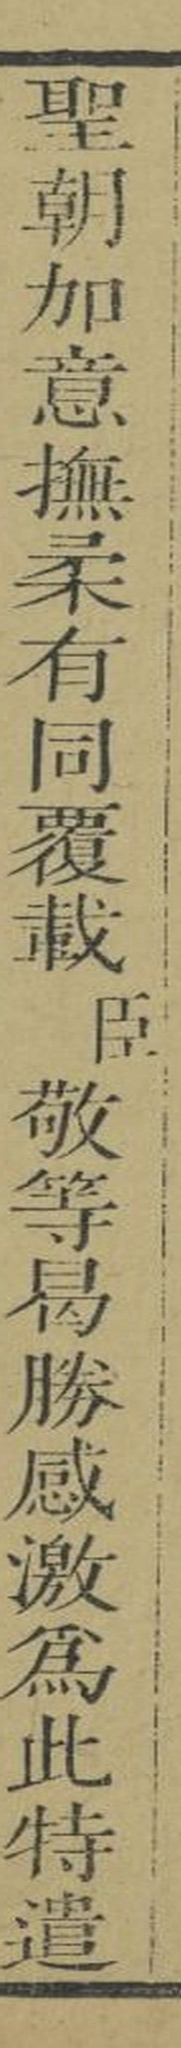聖朝加意撫柔有同覆載臣敬等曷勝感激爲此特遣
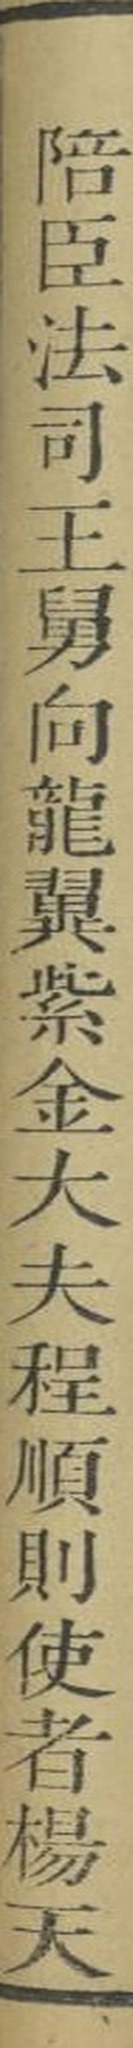陪臣法司王舅向龍翼紫金大夫程順則使者楊天
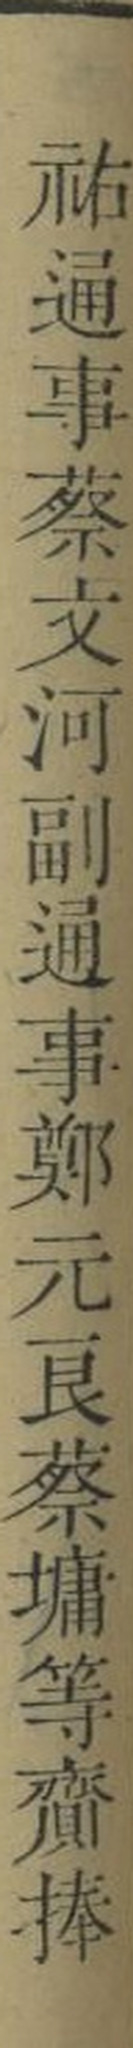祐通事蔡文河副通事鄭元良蔡墉等齎捧
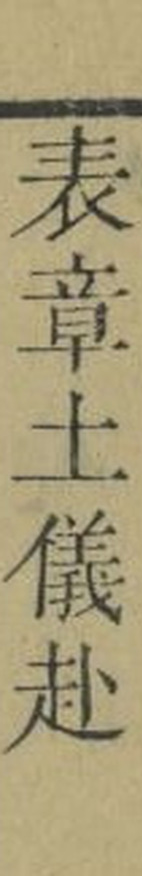表章土儀赴
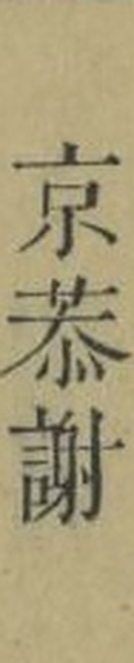京恭謝
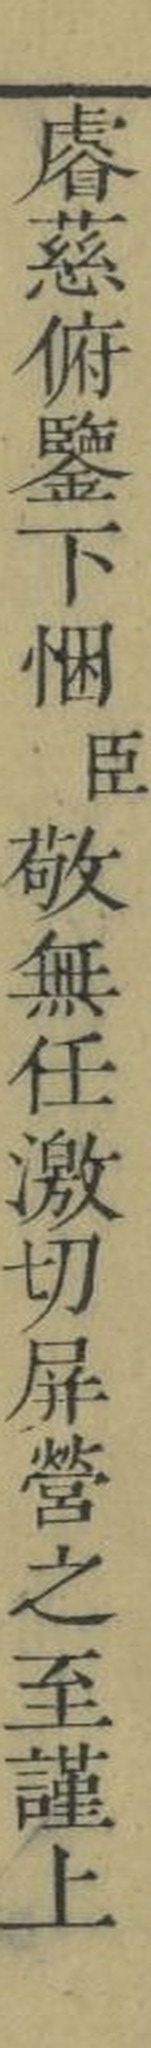睿慈俯鑒下悃臣敬無任激切屏營之至謹上
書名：中山伝信録 巻二
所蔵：University of the Ryukyus Library
